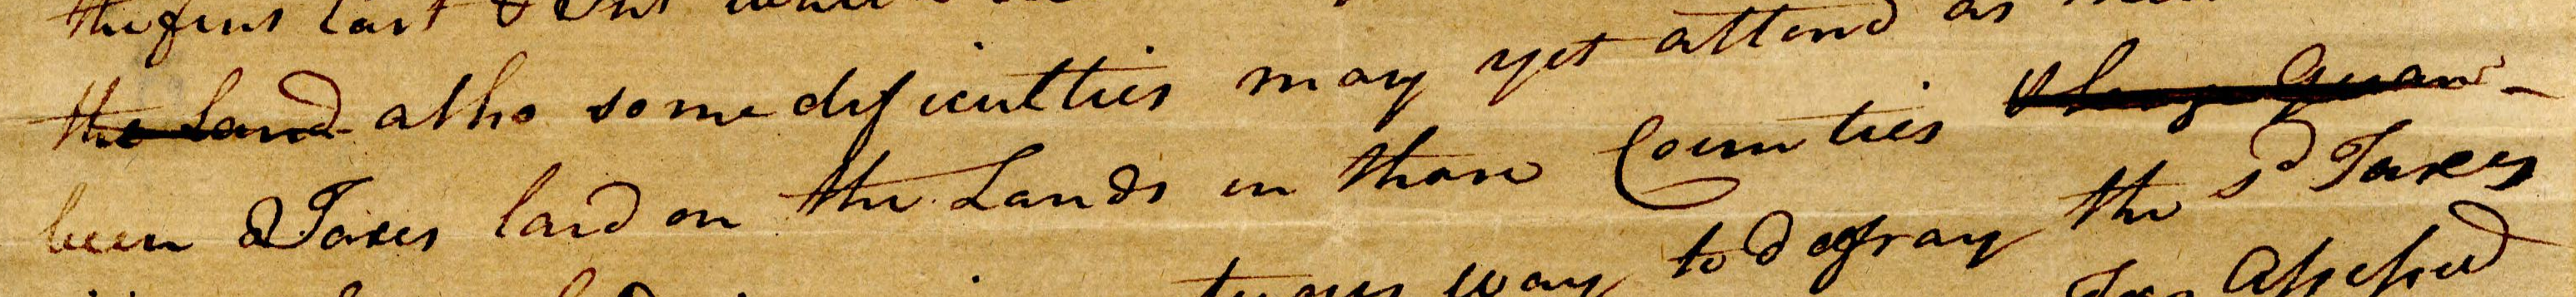been Taxes laid on the Lands in those Counties [& large quan]
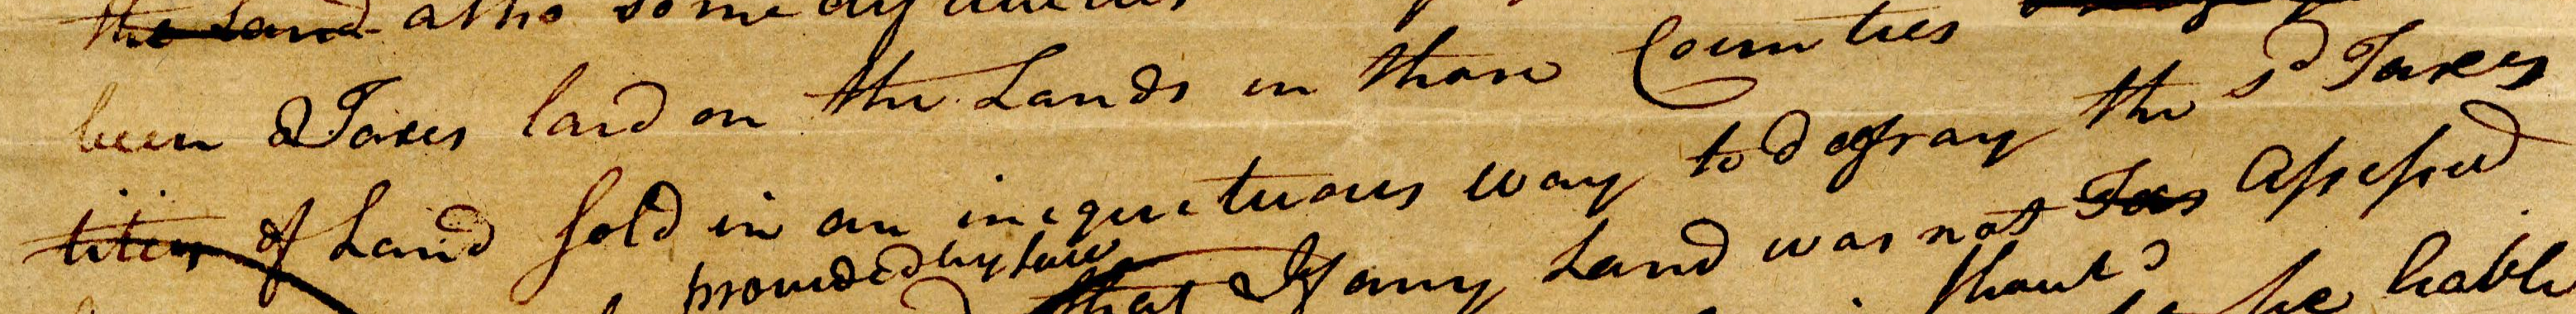tities of Land sold in an iniquituous way to defray the s^d Taxes
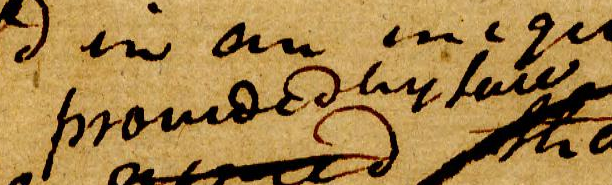provided by Law
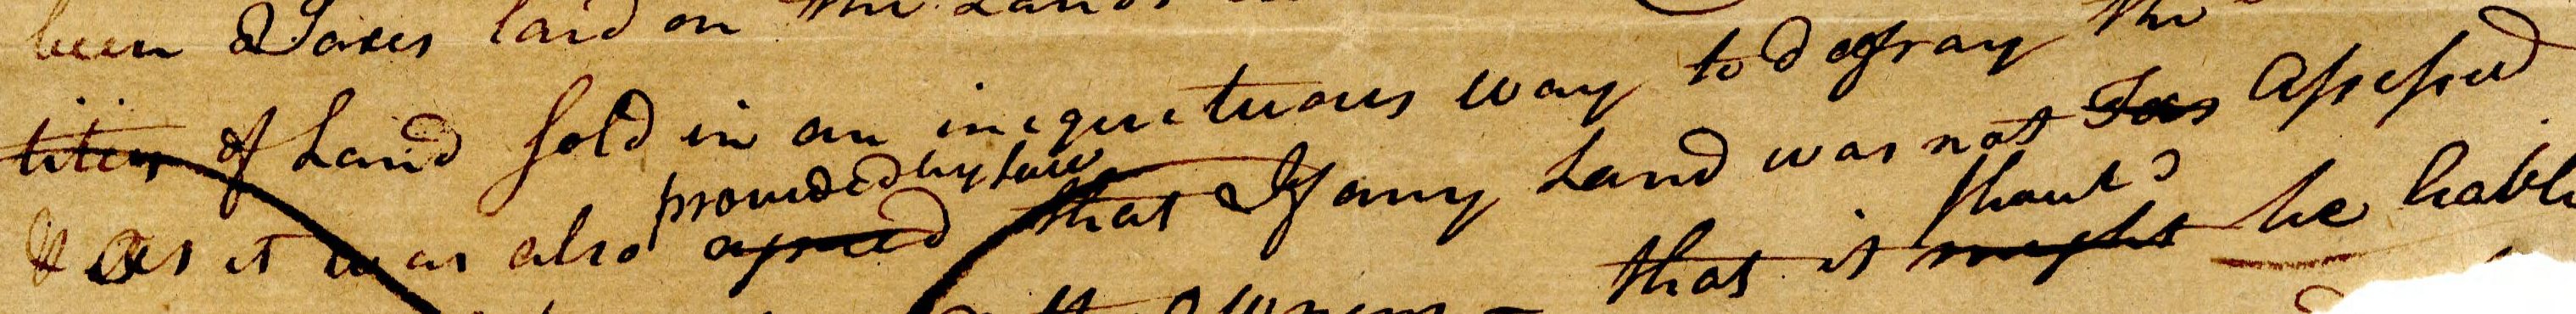& as it is an also [agreed] that If any Land was not [Tax] assessed
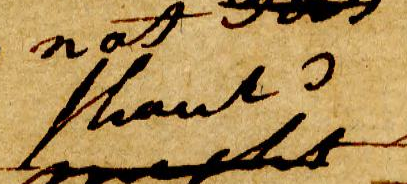should
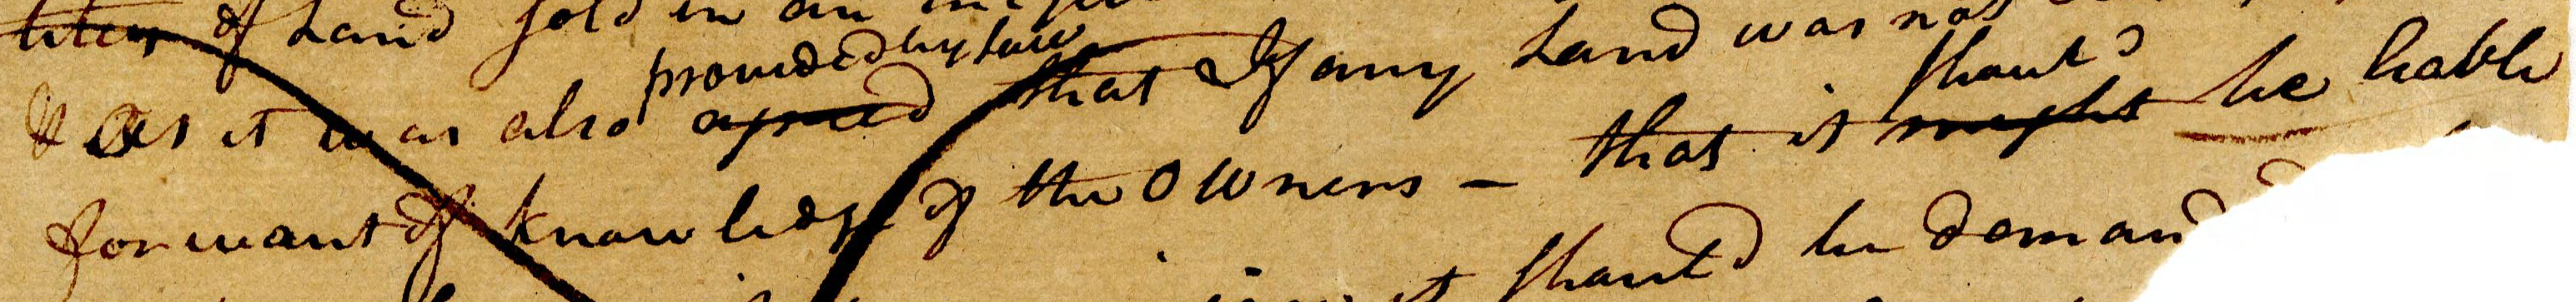for want of knowledge of the owners - that it [might] be liable
